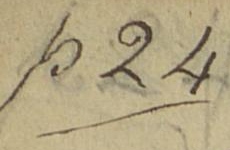p24
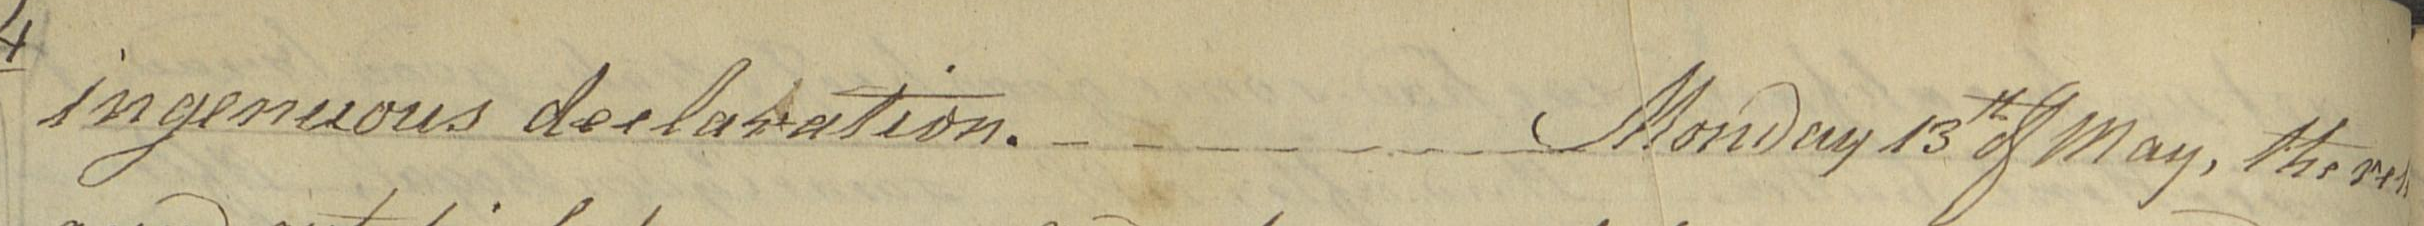ingenuous declaration. Monday 13^th of May, there
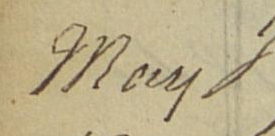May
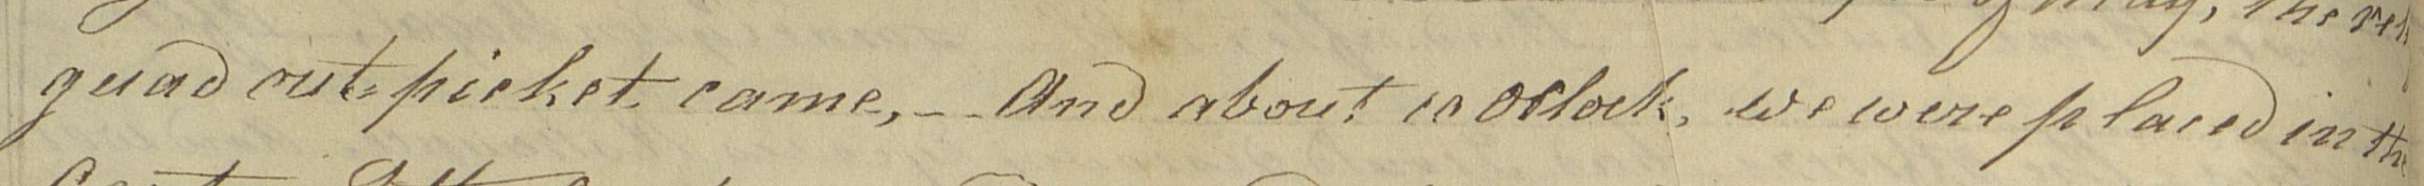quad out picket came, And about 12 O Clock, we were placed into
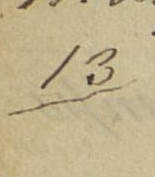13
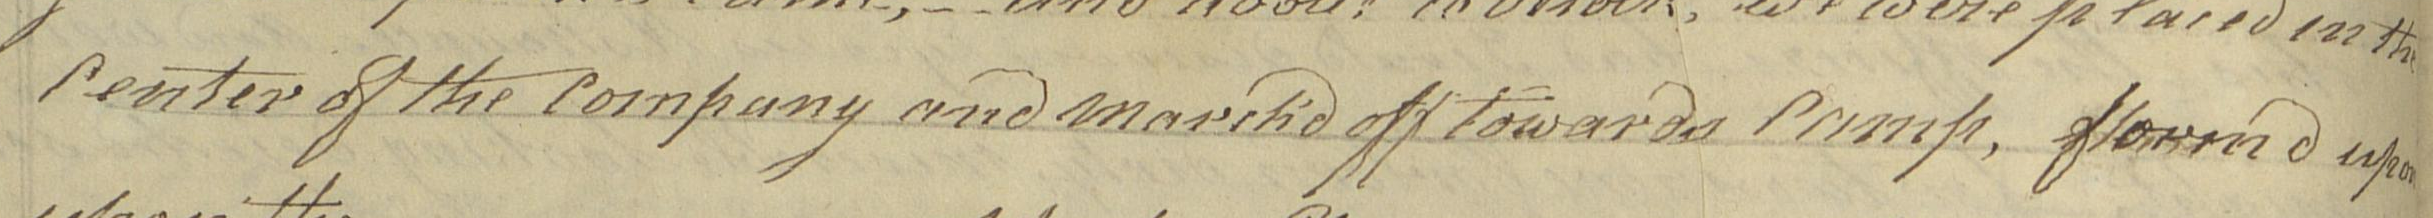Center of the company and march'd off towards Camp, stormd upon
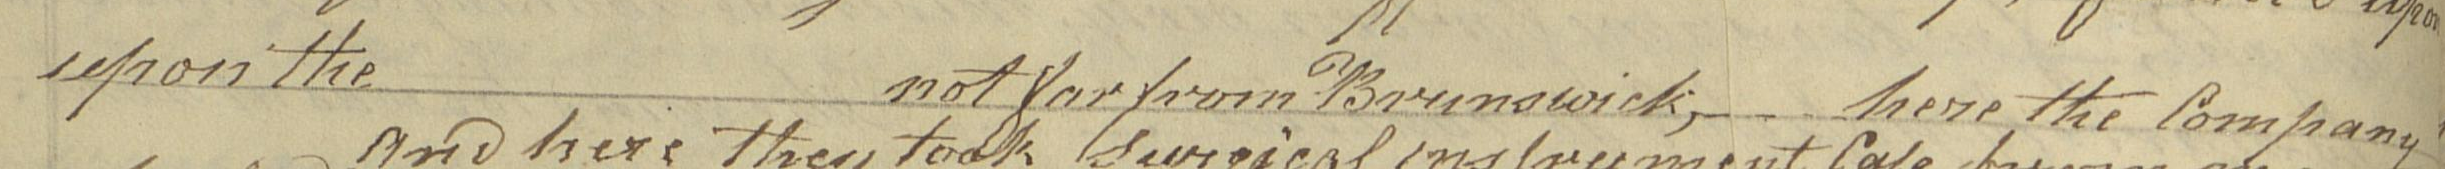upon the not far from Brunswick; here the Company
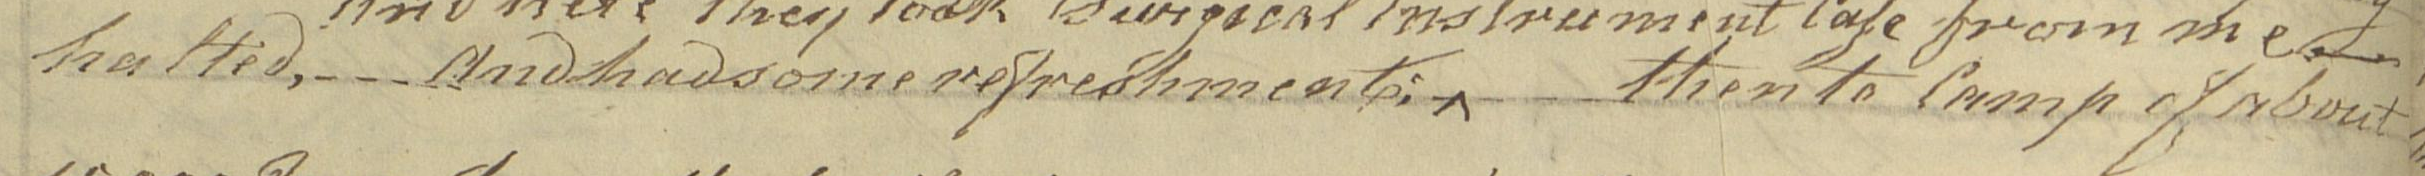halted. And had some refreshment: ^ then to Camp of about
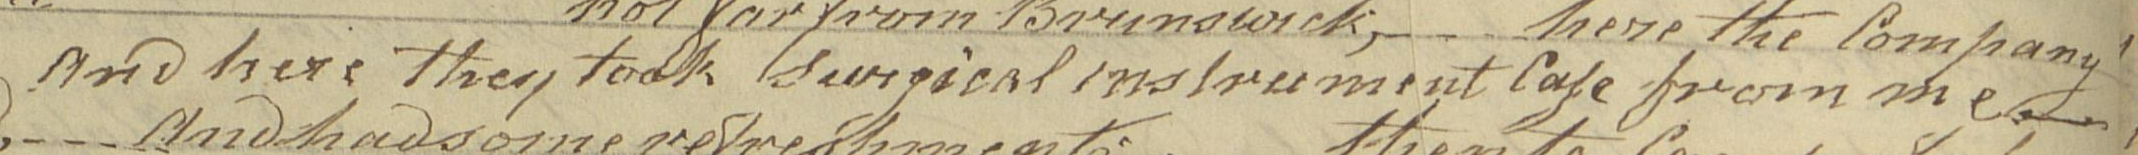and here they took surgical instrument Case from me.
